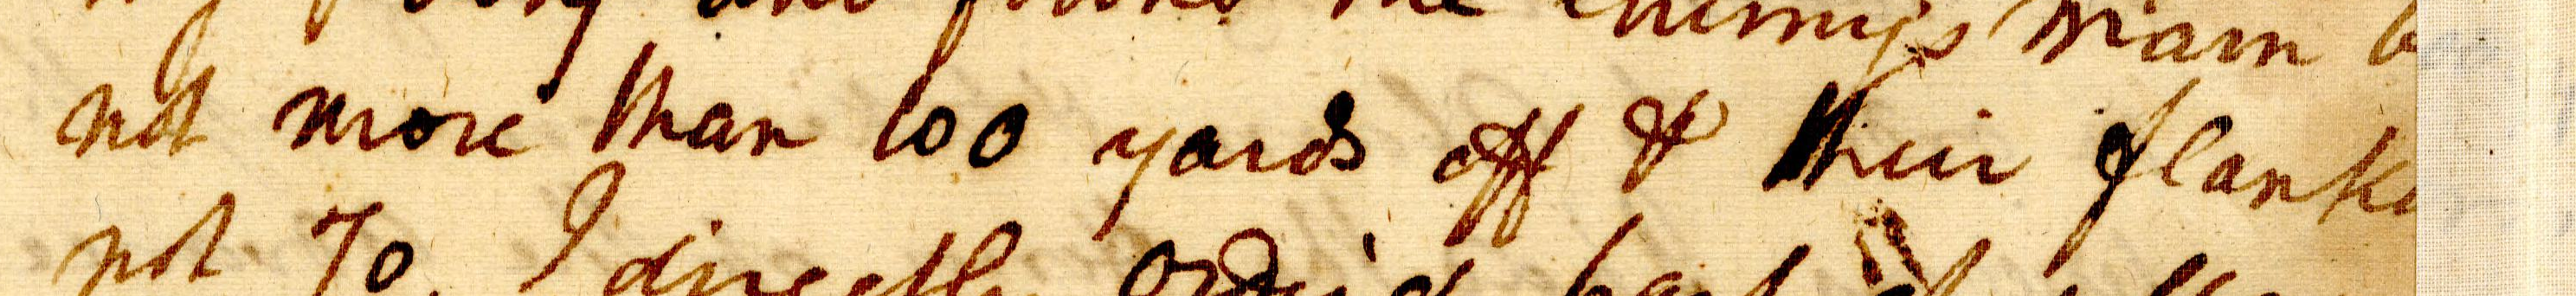not more than 100 yards off & their flankers
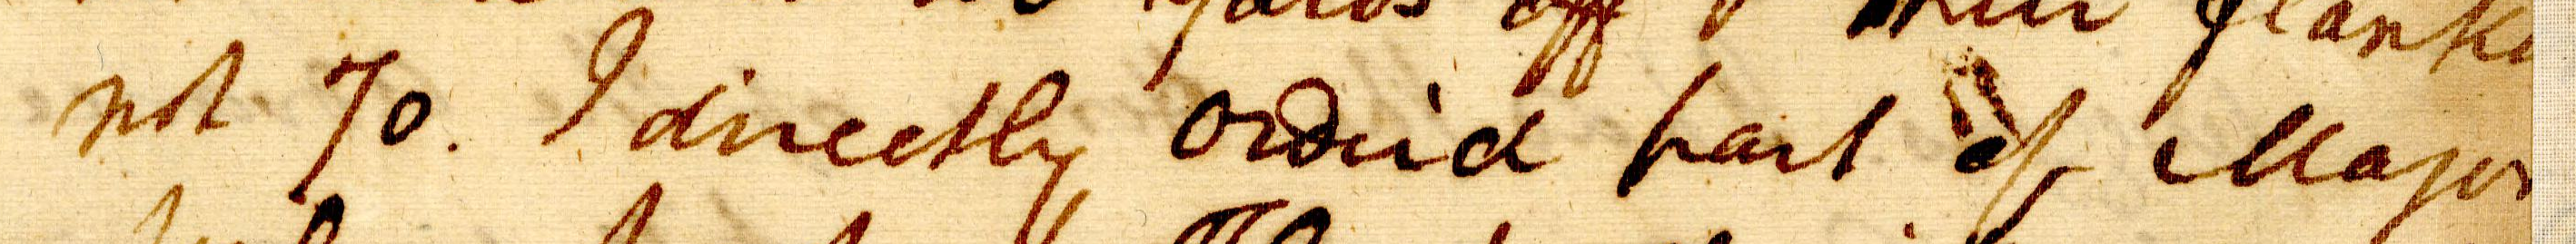not 70. I directly order'd part of Major
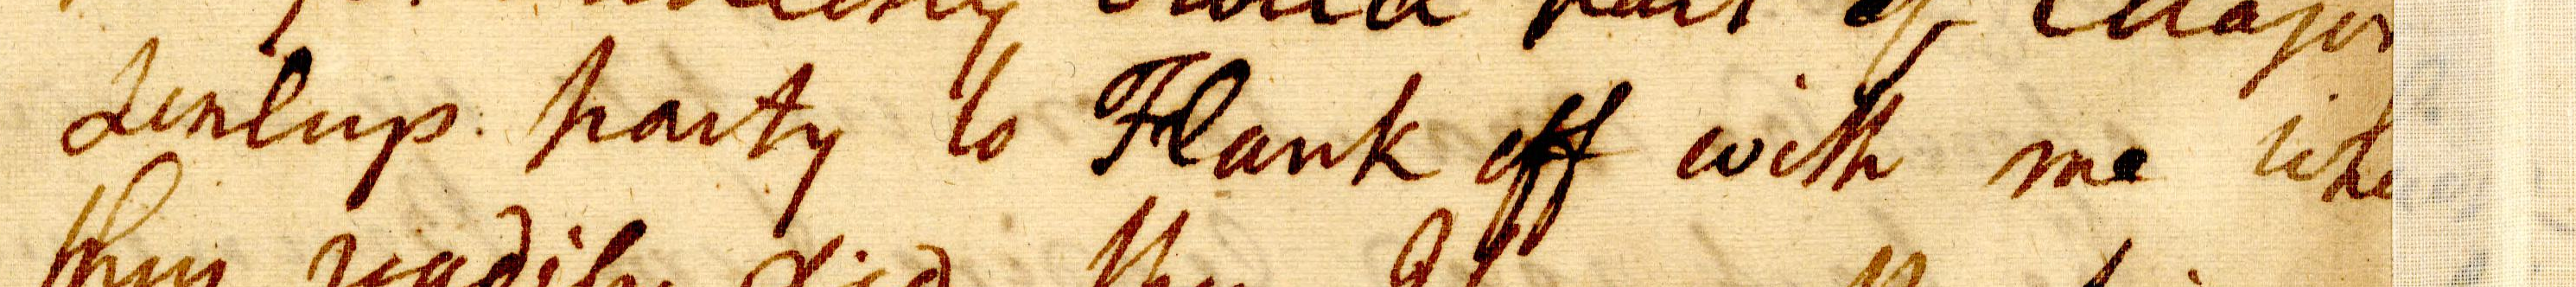Lenleys party to Flank off with me which
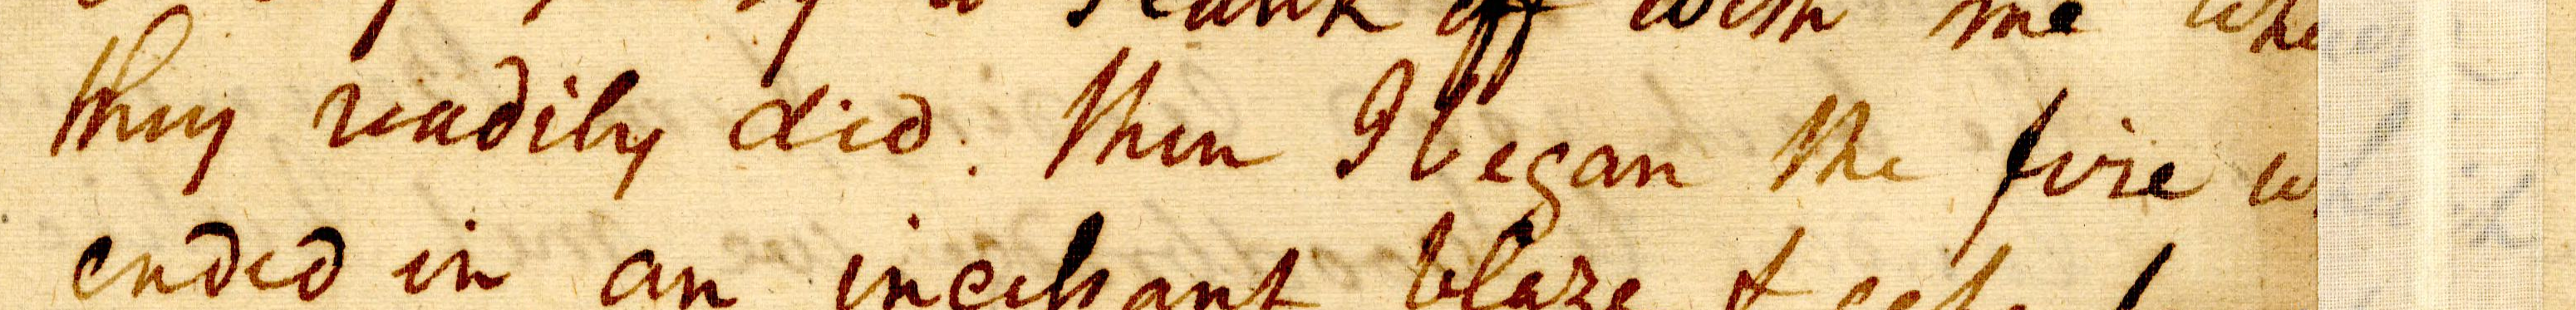they readily did then I began the fire which
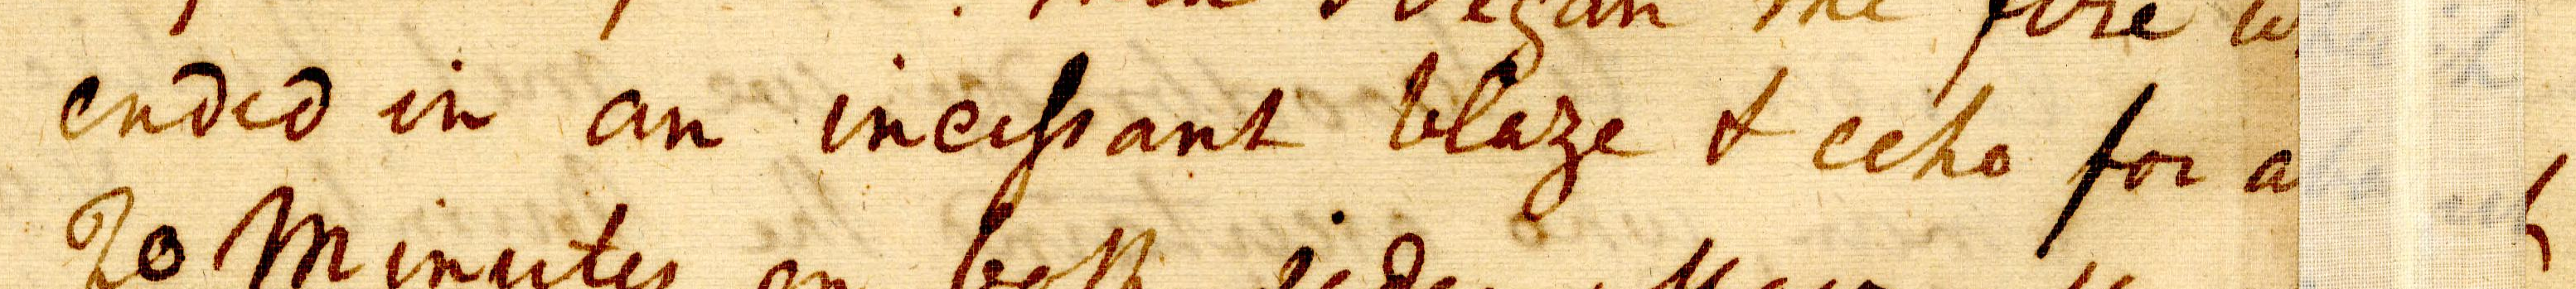ended in an incessant blaze & echo for about
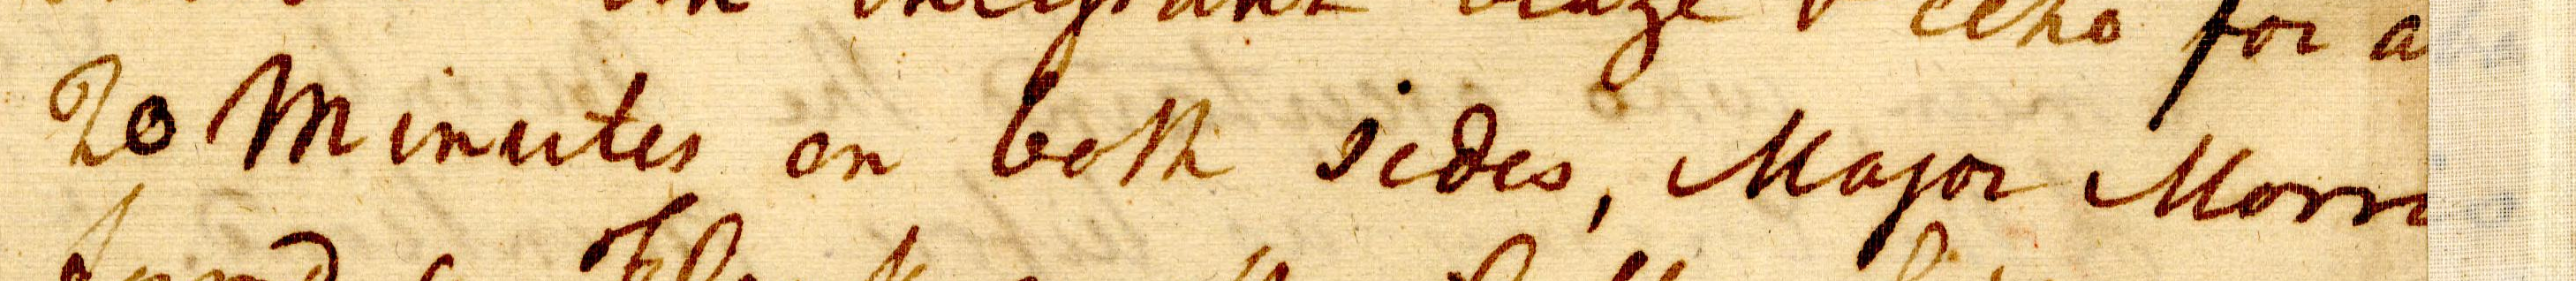20 Minutes on both sides, Major Morris
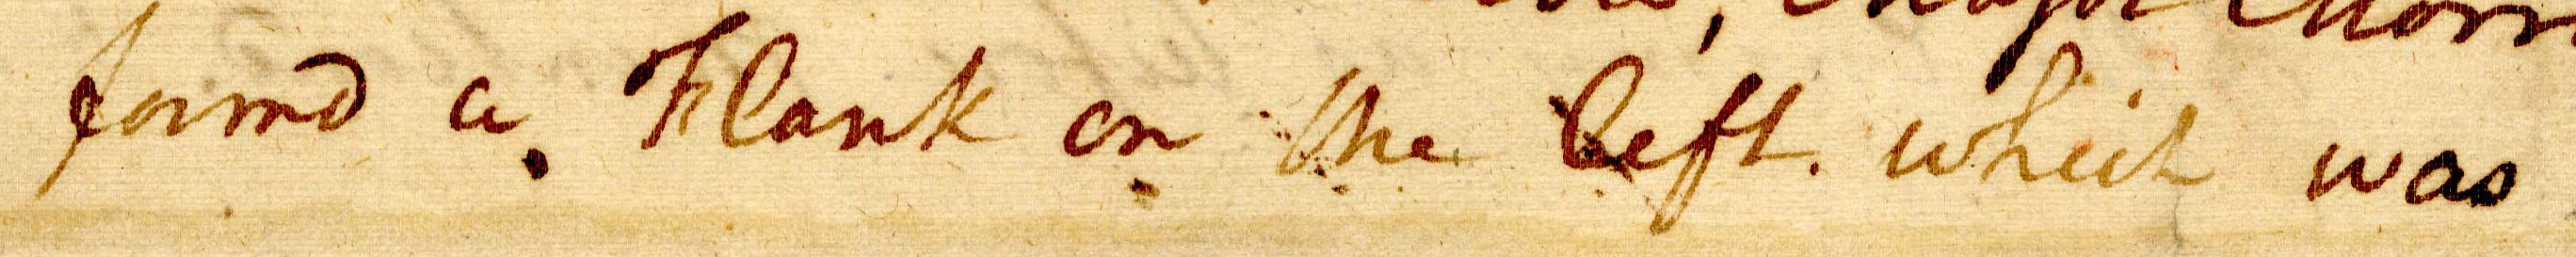formd a Flank on the left which was
